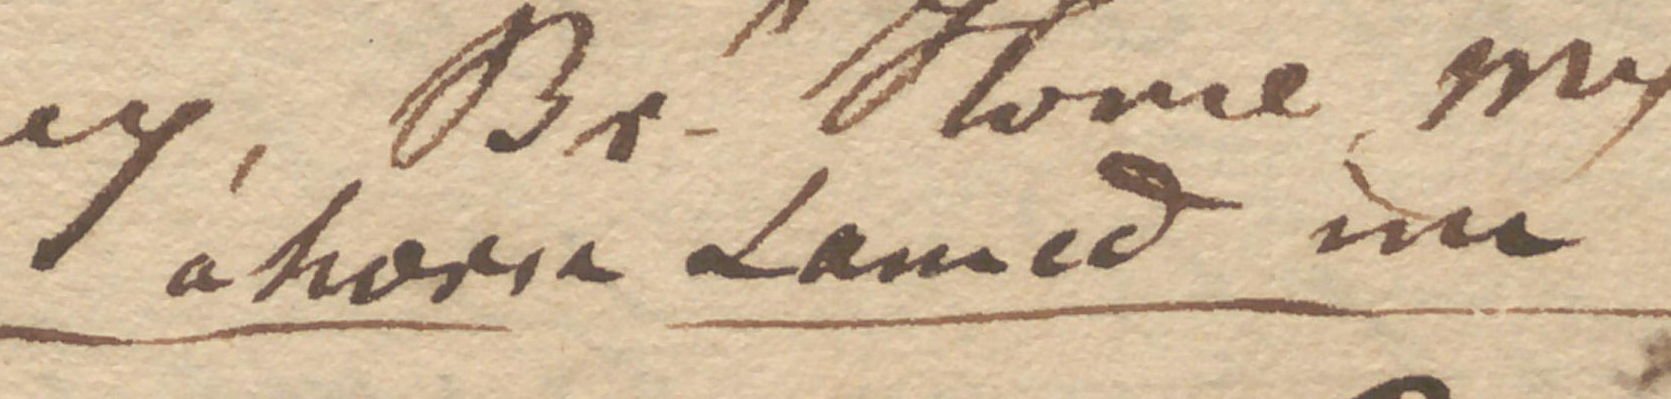a horse Lamed me
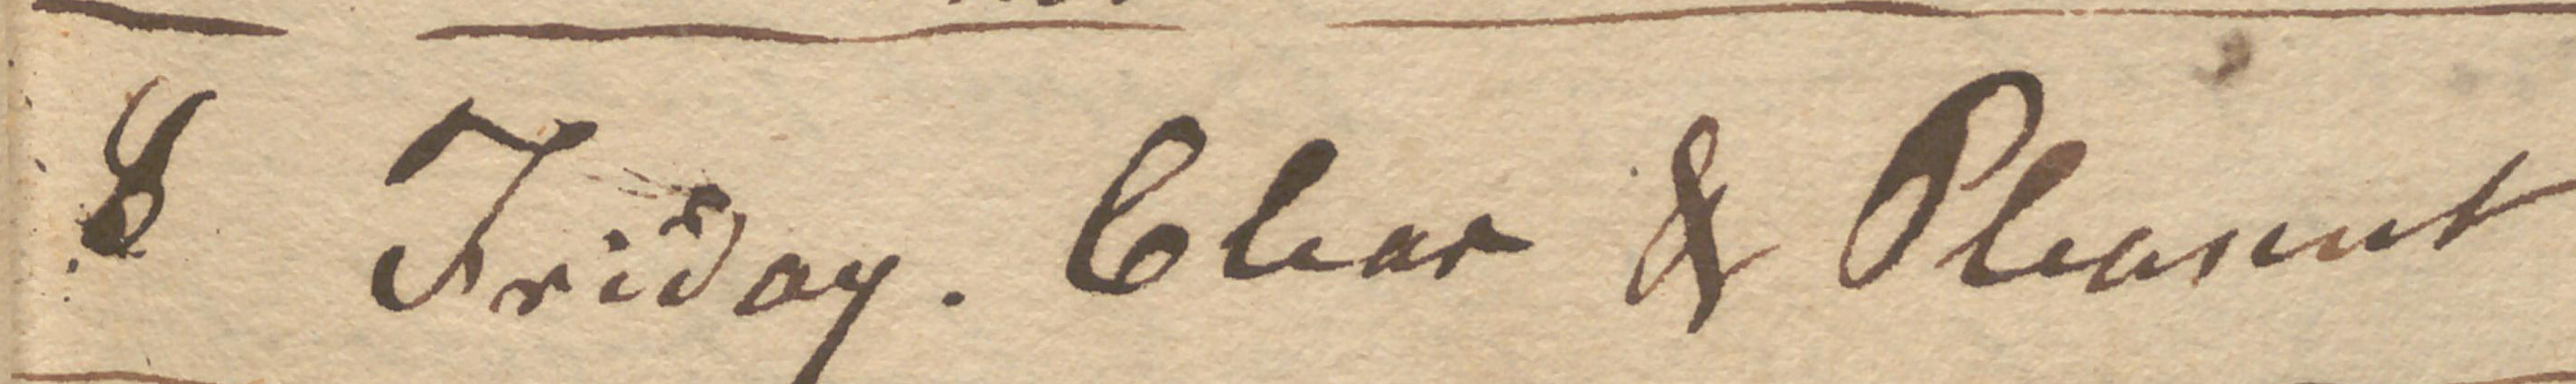8 Friday. Clear & Pleasent
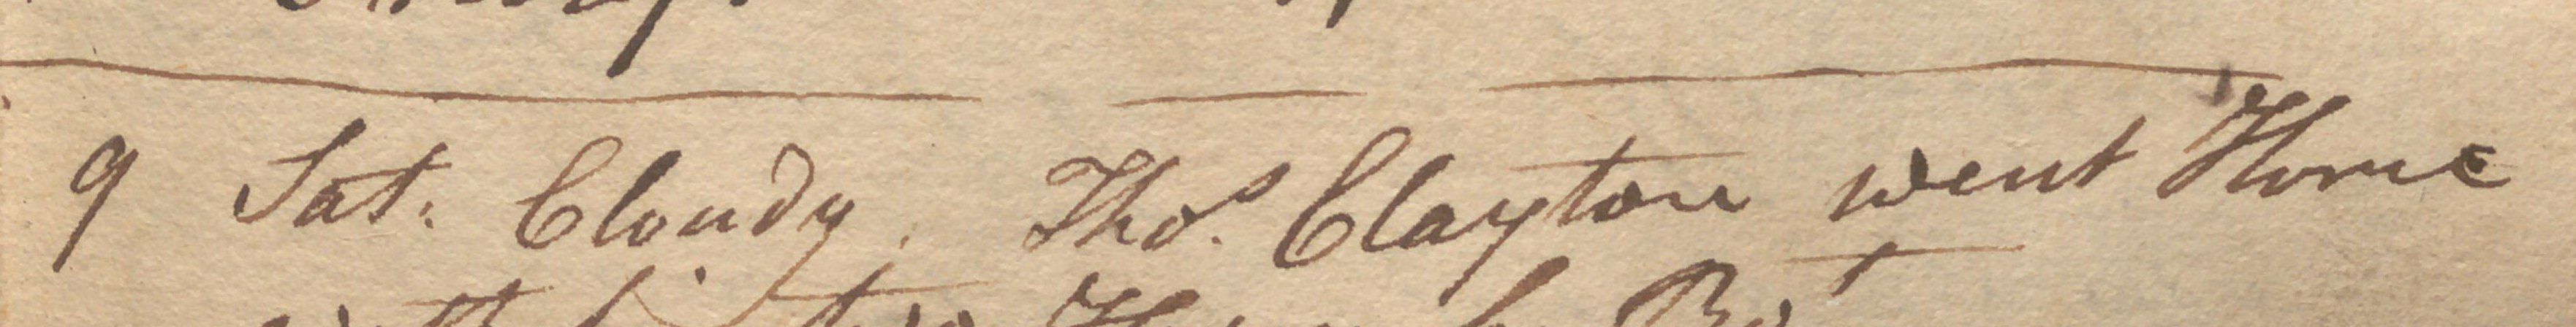9 Sat. Cloudy. Tho^s. Clayton went Home
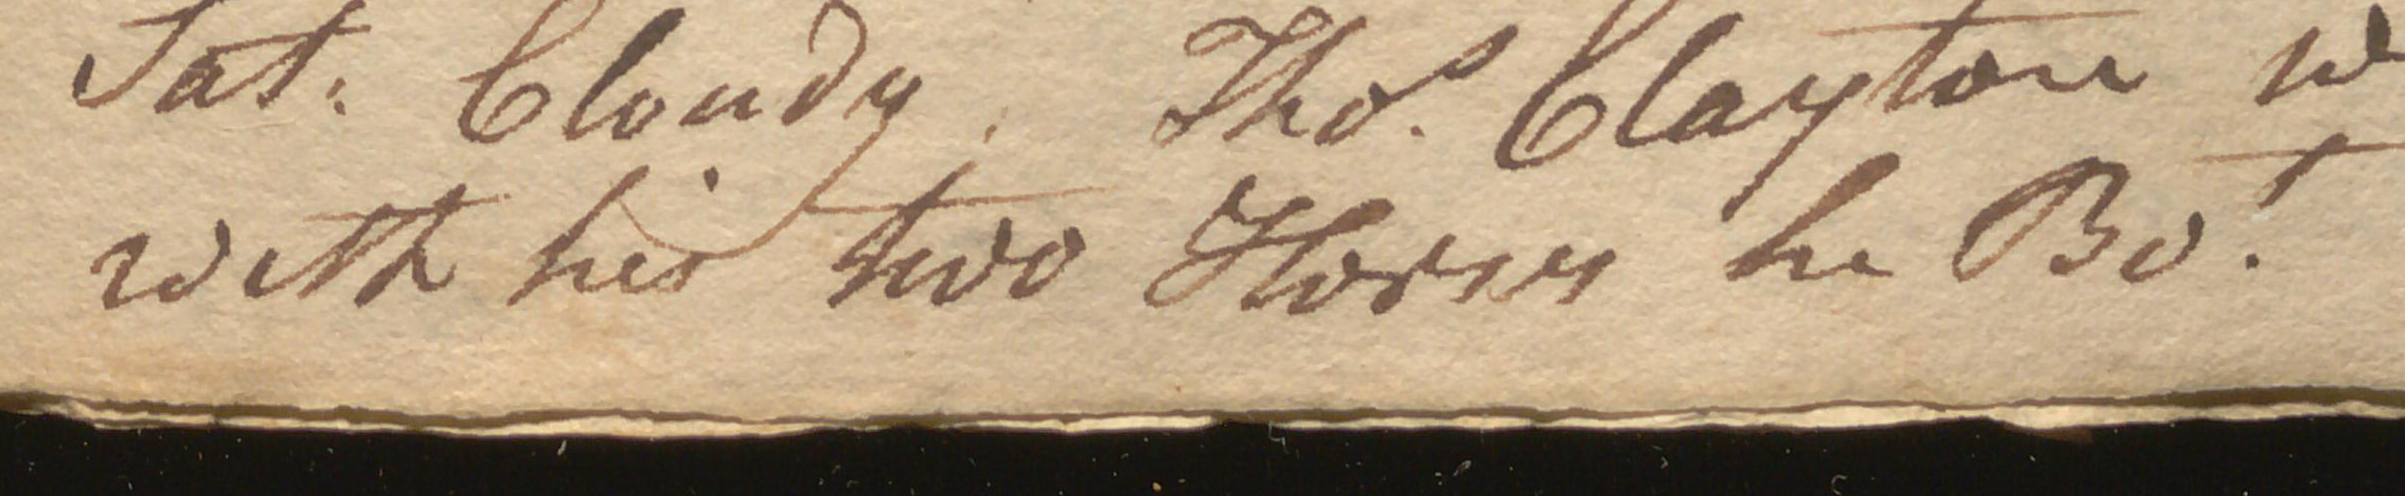with his two Horses he Bo^t.
